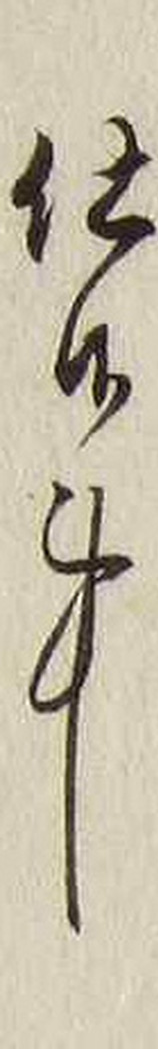仕候事
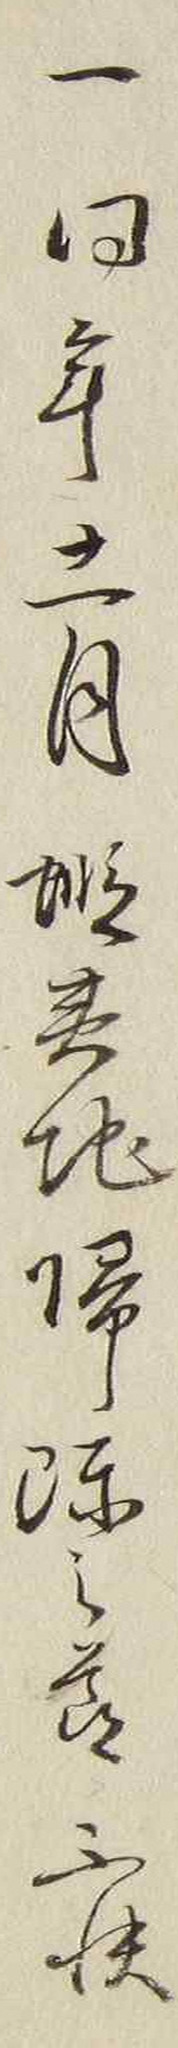一同年十一月蝦夷地帰陣之節不快

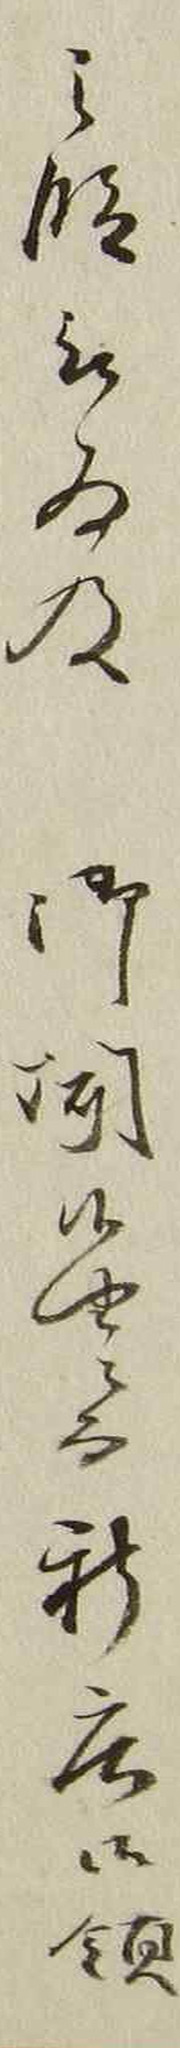之段被為及御聞候由にて新庄御領
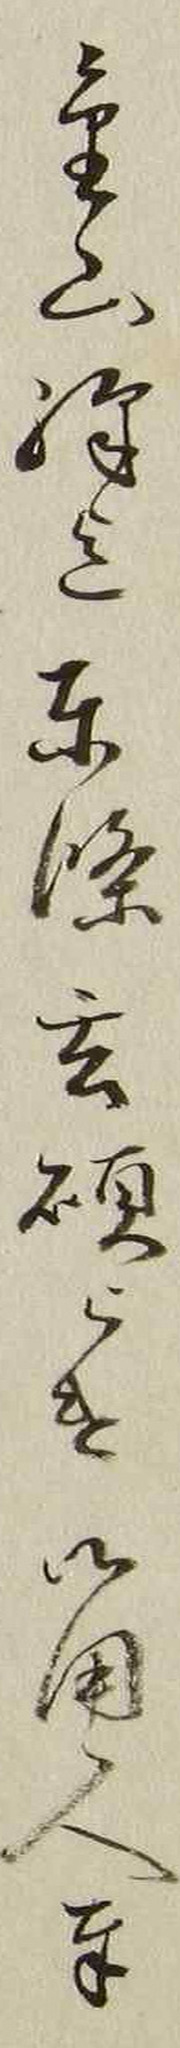金山駅迄東條玄碩被遣御用人奉
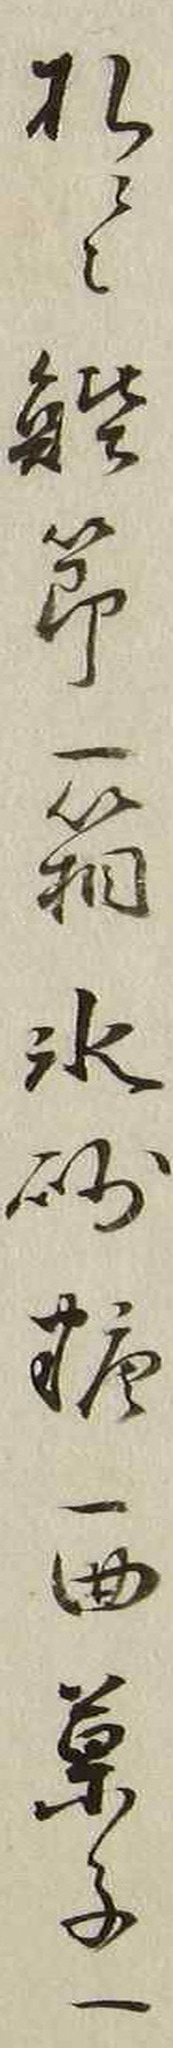札にて鰹節一箱氷砂糖一曲菓子一
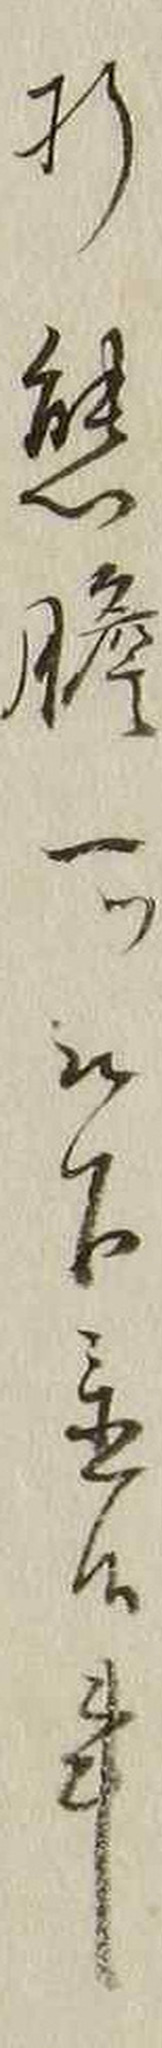折態膽一つ被下置候事
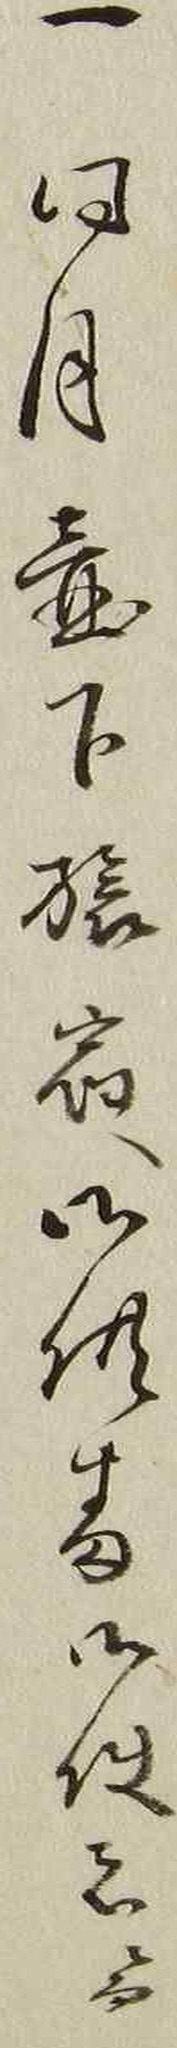一同月壷下旅宿へ御供番御使者に而
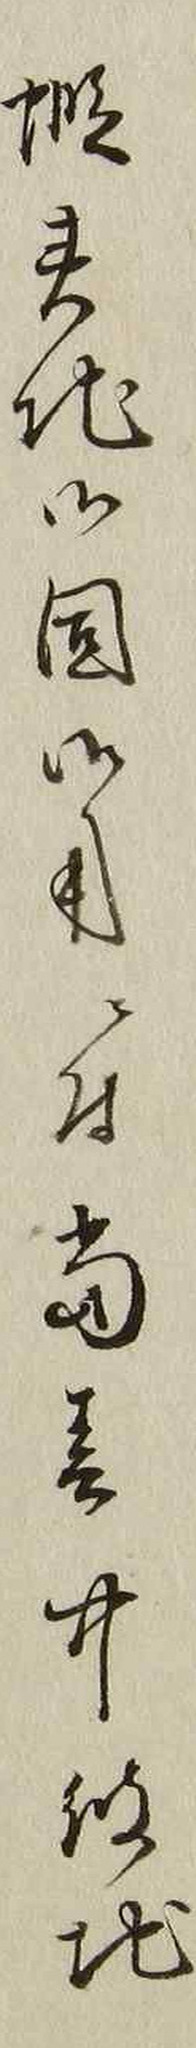蝦夷地御固御用に付当春中彼地
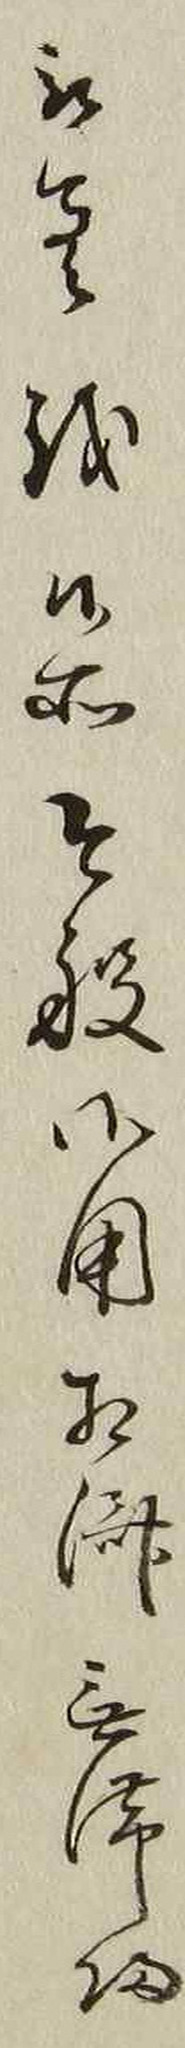江差越候所今般御用相済無滞帰
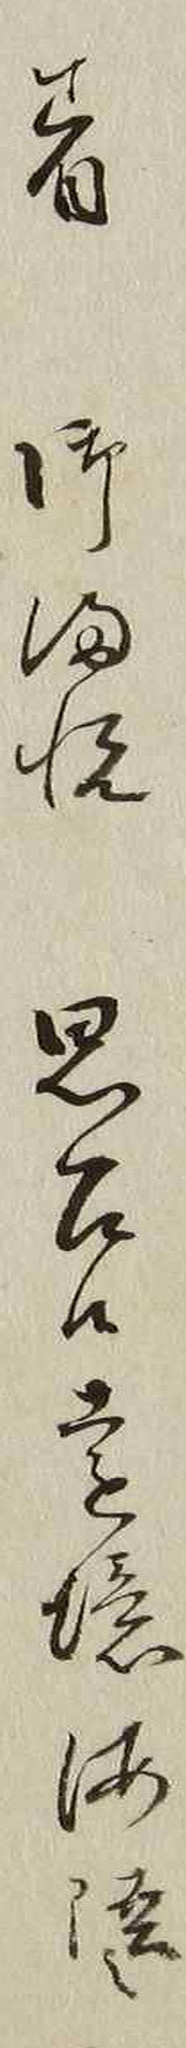着御満悦思召候遠境海陸之
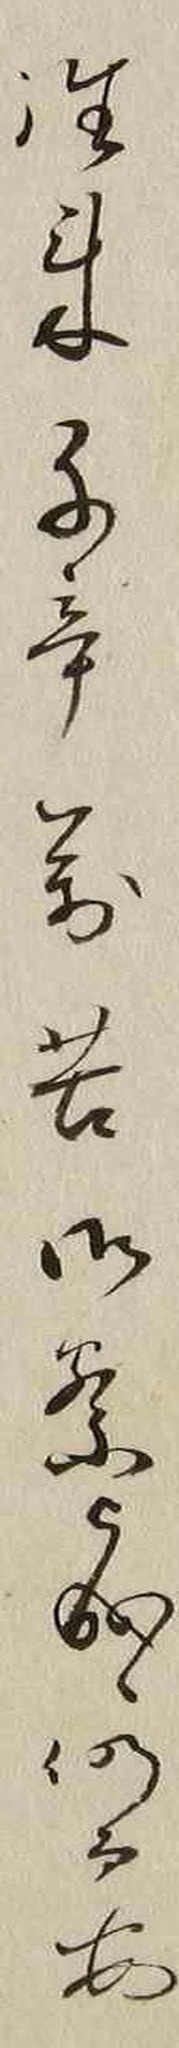往來千辛萬苦御察被成候仍而安
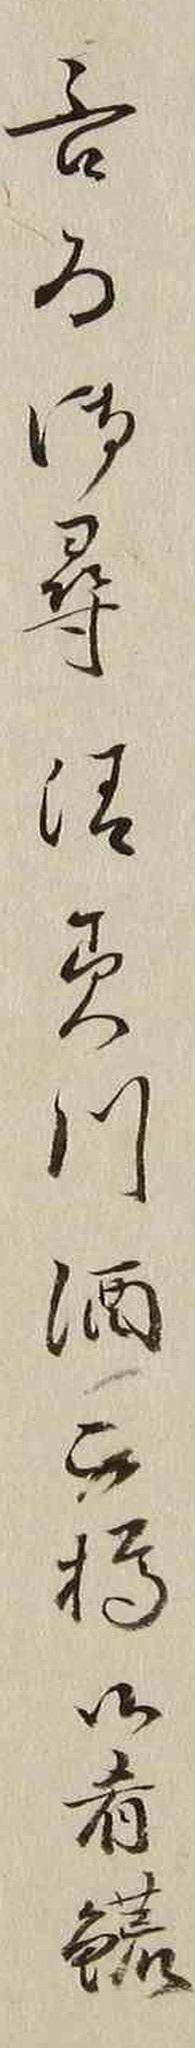否為御尋清美川酒二樽御肴
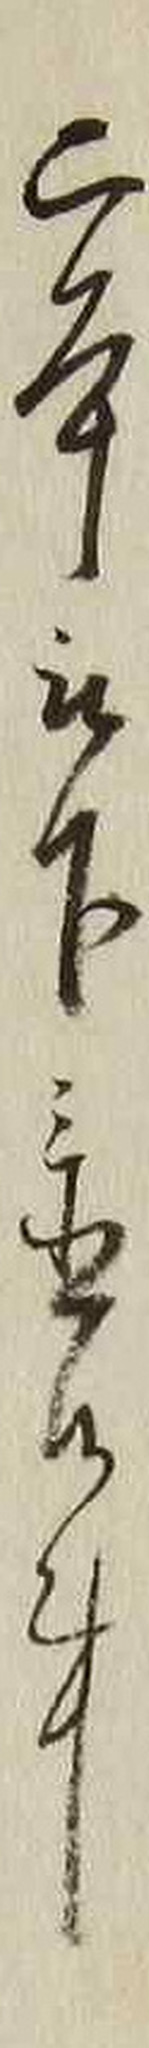二本被下置候事
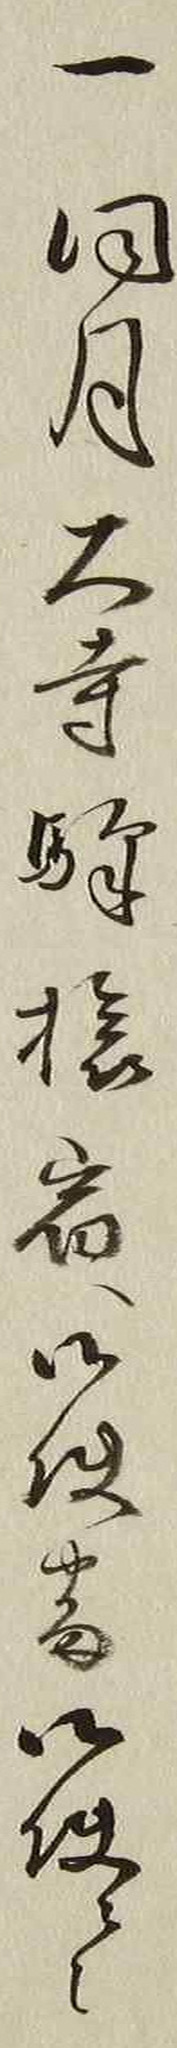一同月大寺駅旅宿へ御供番御使にて
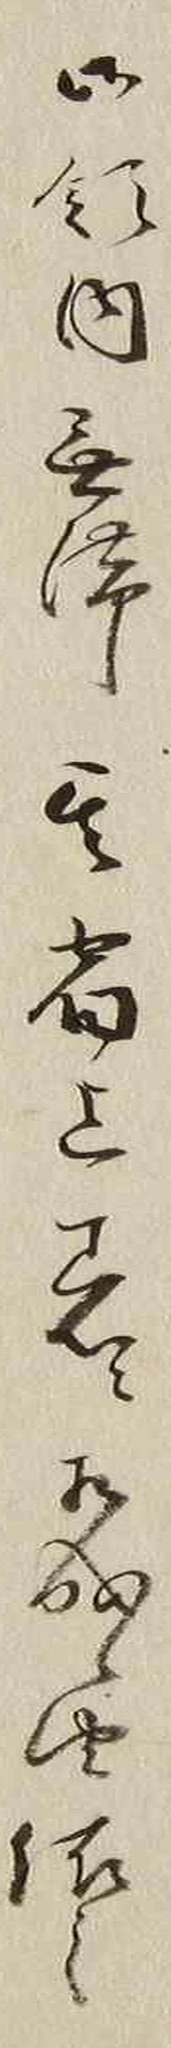御領内無滞其宿迄着に相成候由依之
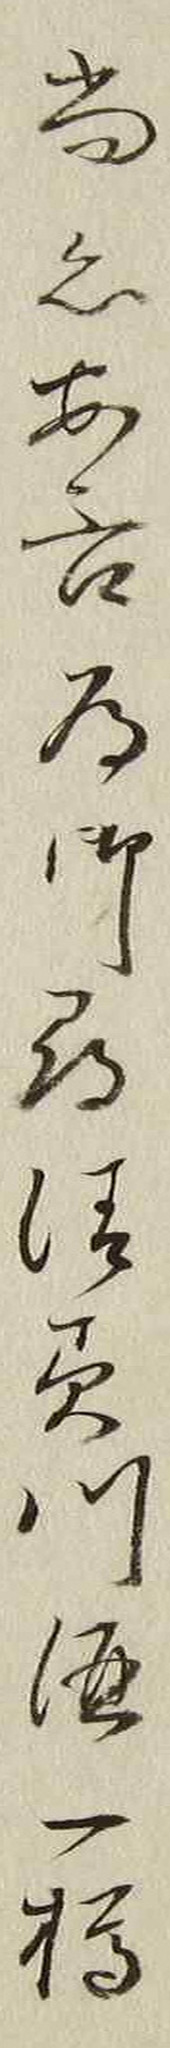尚以安否為御尋清美川酒一樽
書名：諸士系譜　巻之159　な之部1
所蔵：会津若松市立会津図書館
